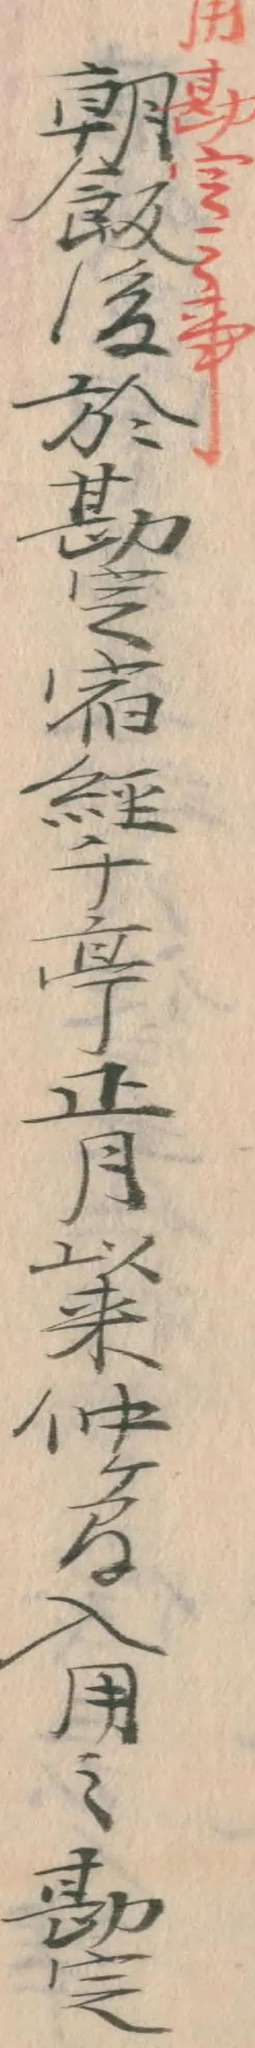一朝飯後於勘定宿経千亭正月以来仲ヶ間入用之勘定
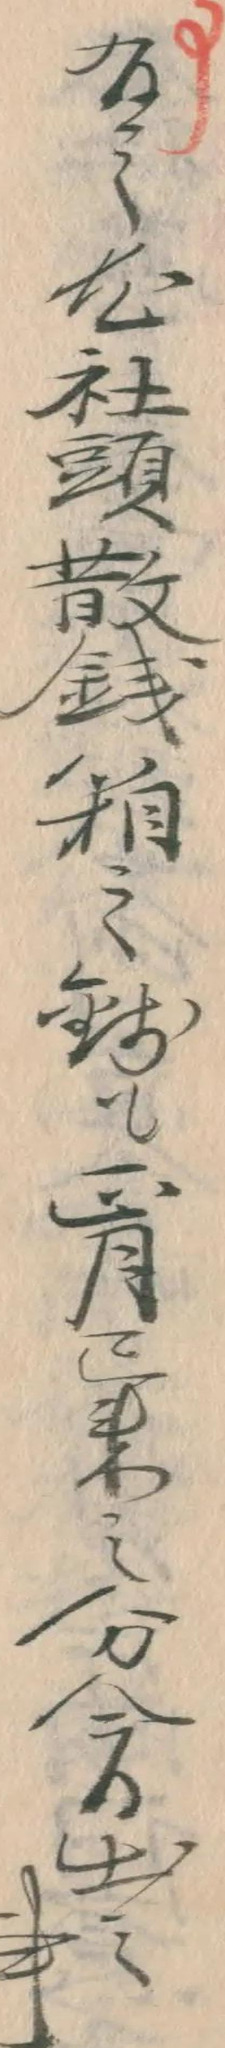有之尤社頭散銭箱之銭も正月已来之分今日出之事
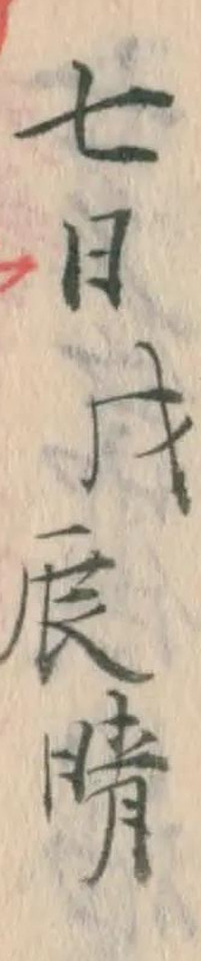七日戊辰晴
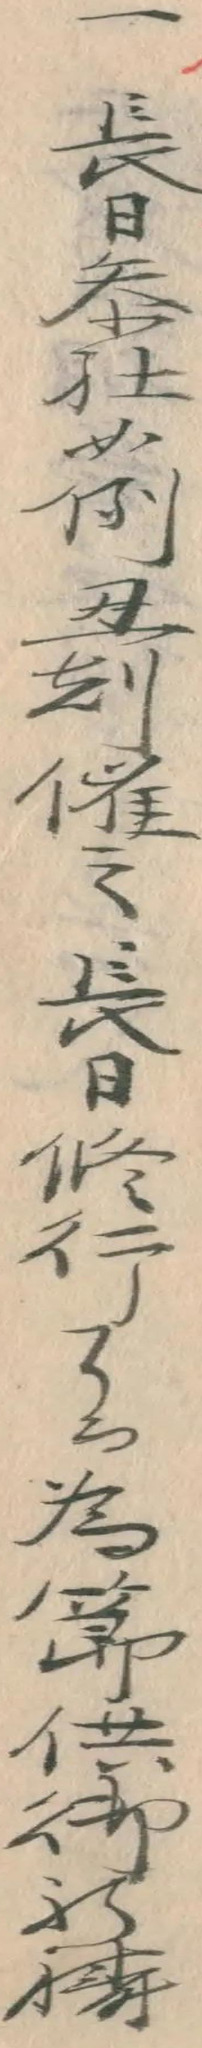一長日参社如例丑刻催之長日修行了而為節供御祈祷
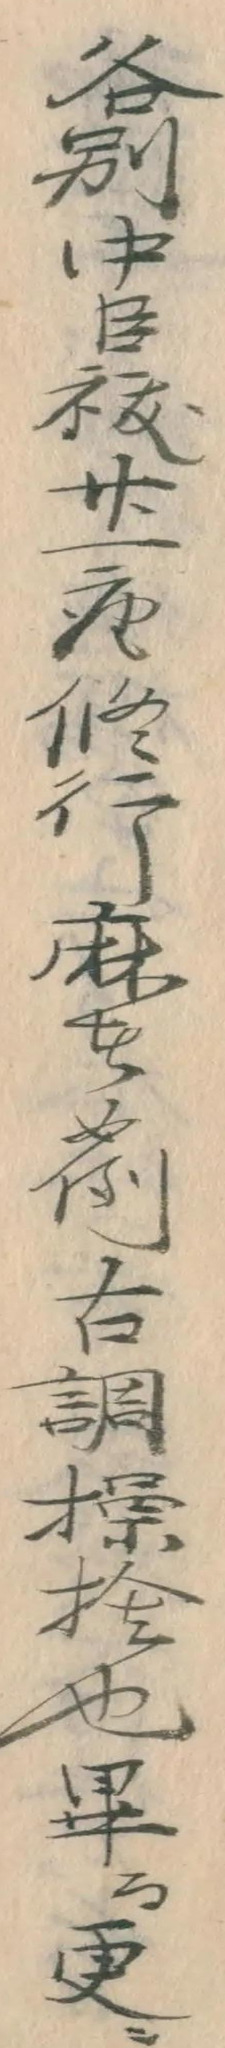各別中臣祓廿一座修行麻者如例古調操捨也畢而更ニ

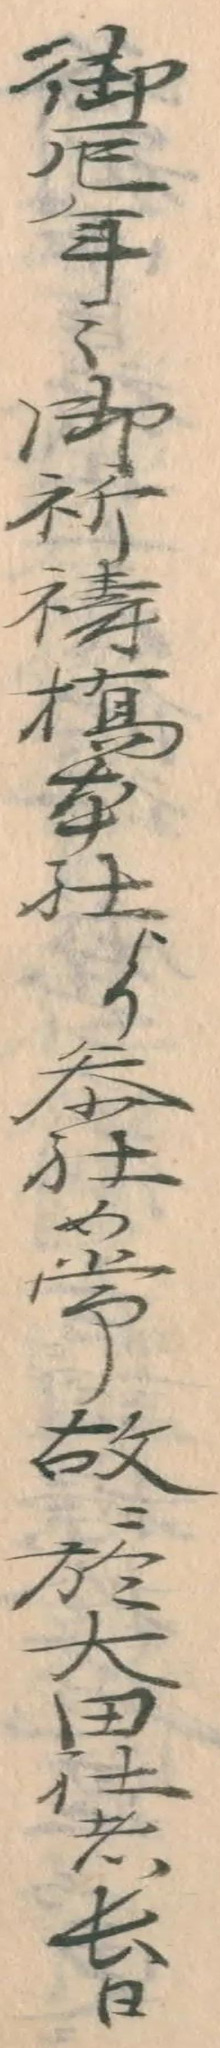御厄年之御祈祷橋本社より参社如常故ニ於大田社は長日
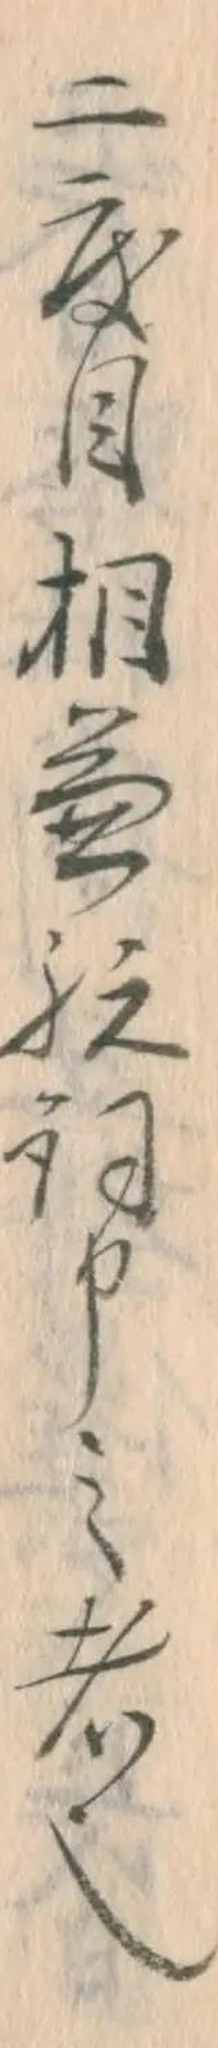二度目相兼祝詞申之者也
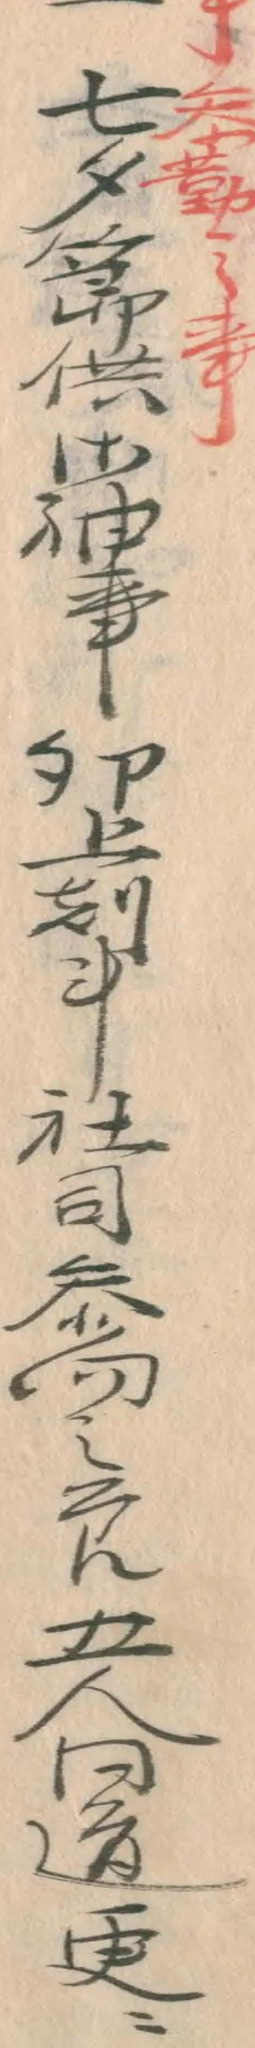一七夕節供御神事卯上刻斗社司参向之節五人同道更ニ
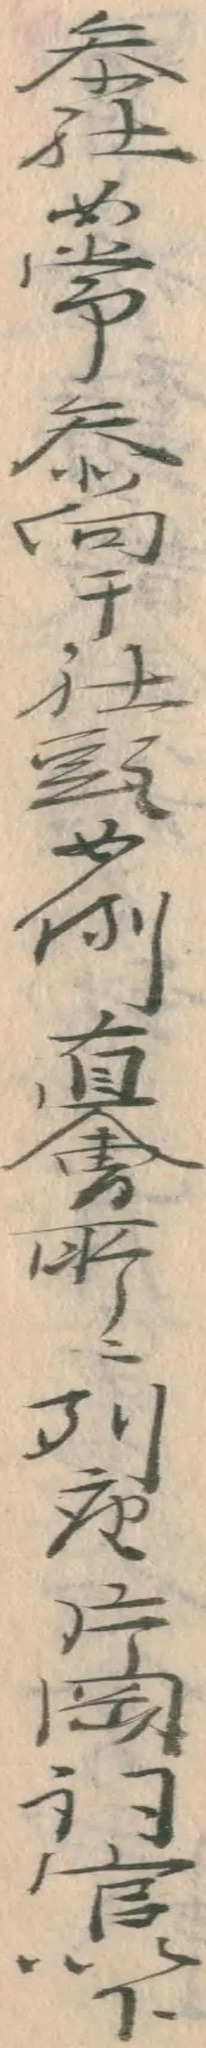参社如常参向于社頭如例直會所ニ列座片岡祠官以下
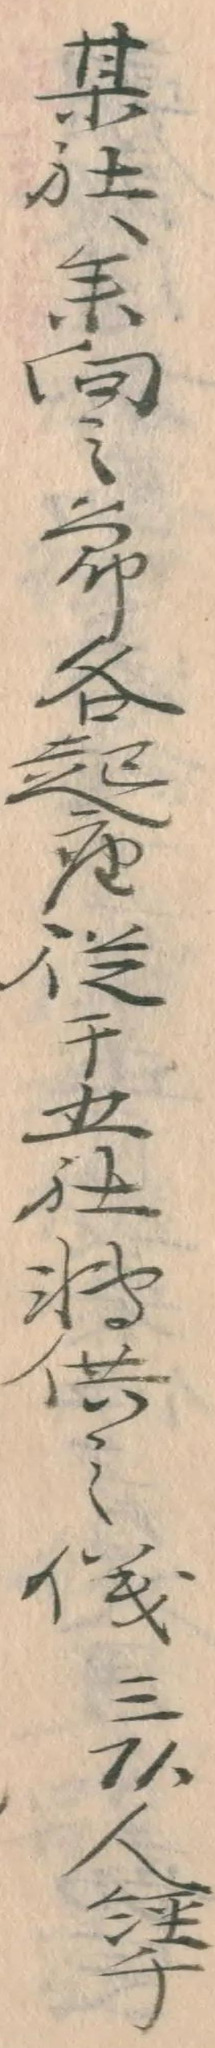某社へ参向之節各起座従于五社轉供之儀三頭人経千
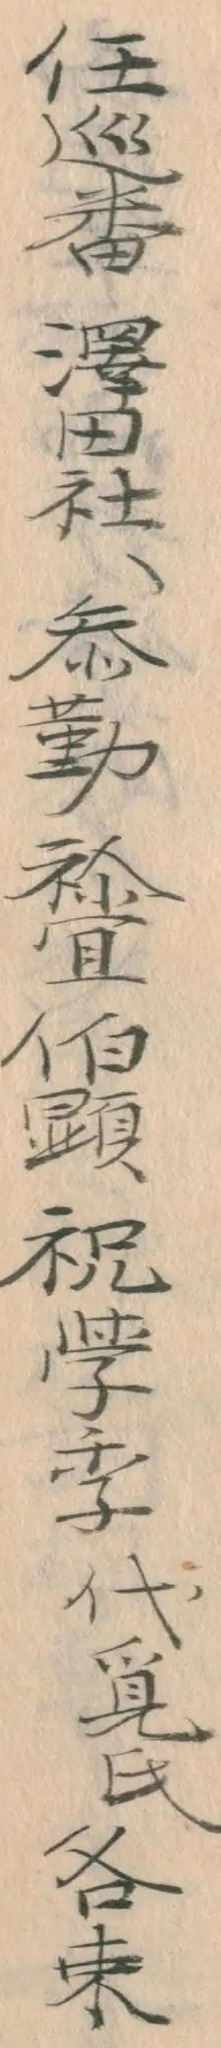任巡番澤田社ヘ参勤祢宜伯顕祝學季代覓氏各束
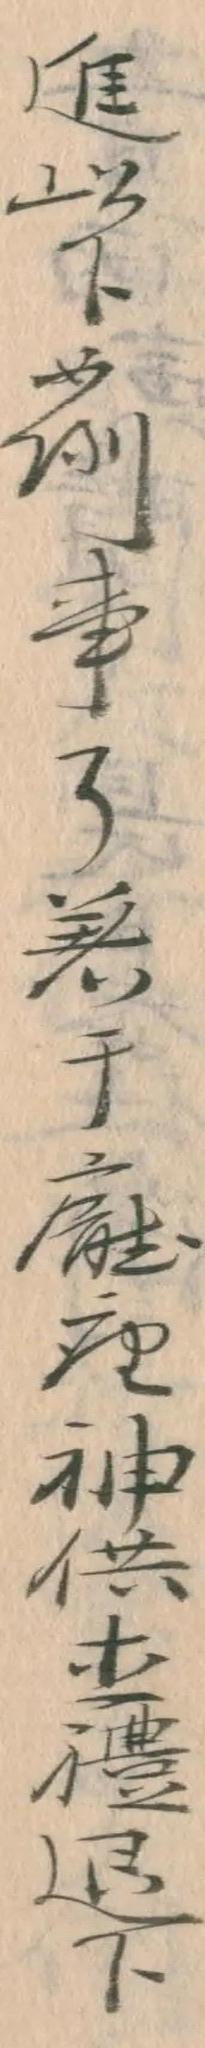進以下如例事了着于廰座神供直禮退下
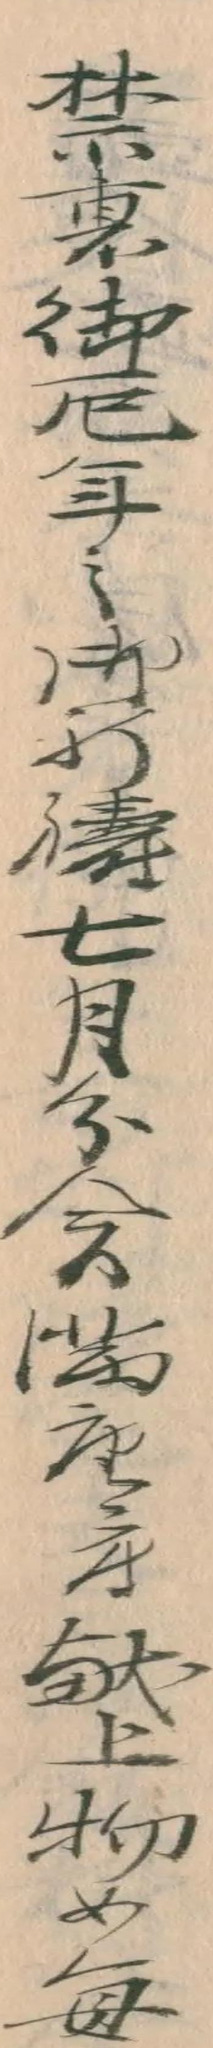一禁裏御厄年之御祈祷七月分今日満座ニ付献上物如毎
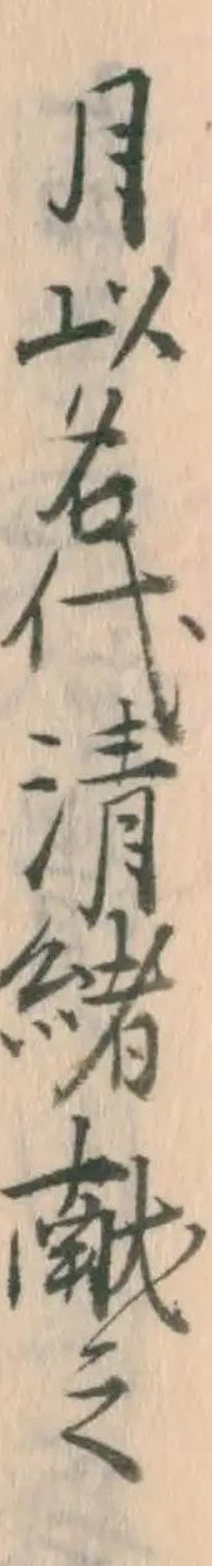月以名代清緒献之
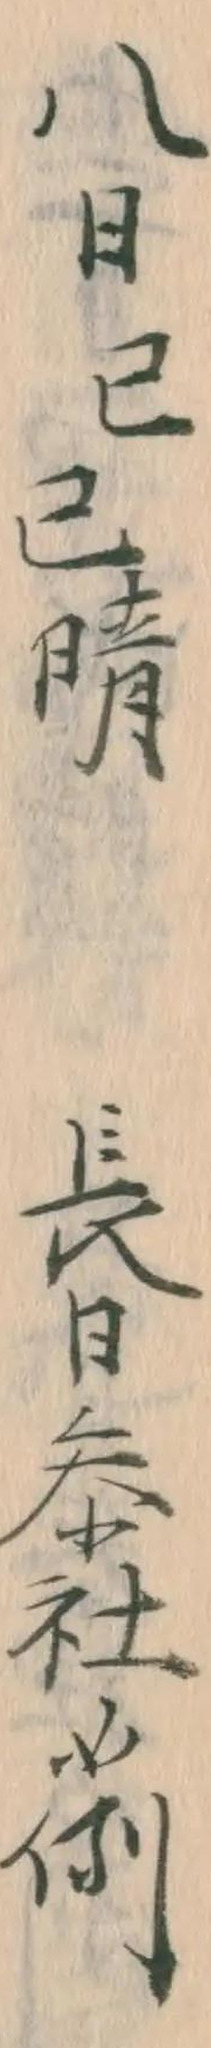八日己巳晴長日参社如例
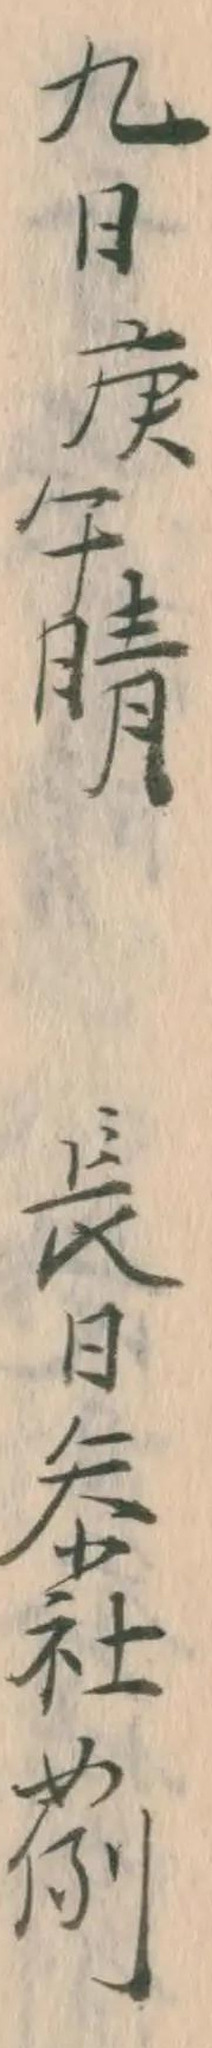九日庚午晴長日参社如例
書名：賀茂社記録. 第73冊
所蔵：国立国会図書館 National Diet Library, JAPAN
